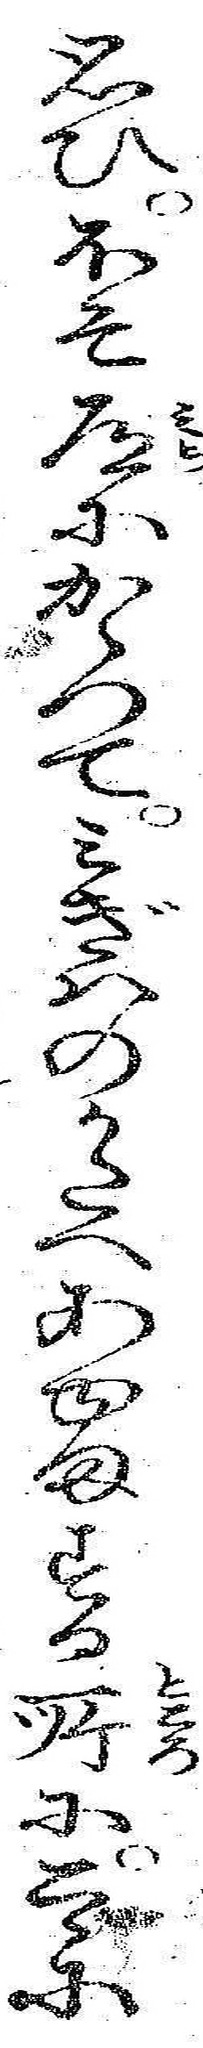思ひ。ほそ道にかゝつて。みぎはのかたへあゆまする所に。こゝに
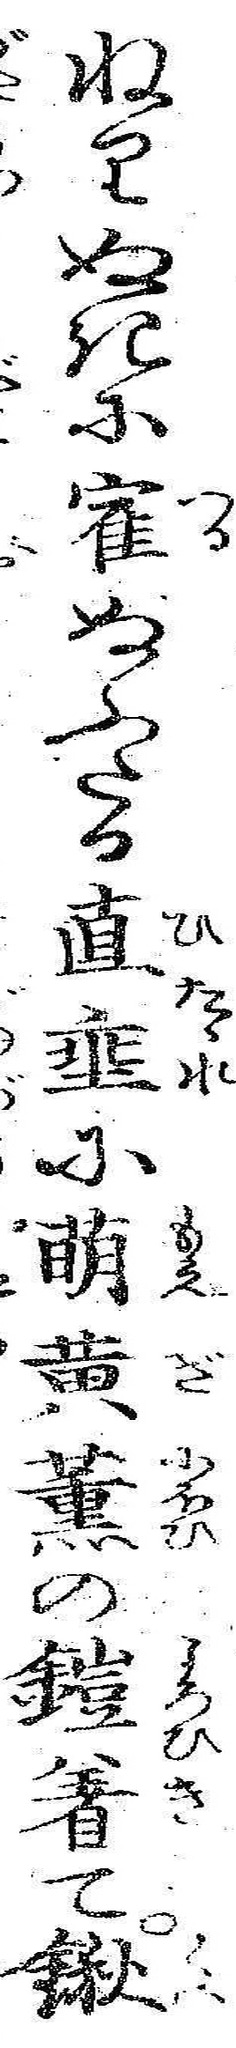ねりぬきに寉ぬふたる直垂に萌黄薫の鎧着て。鍬
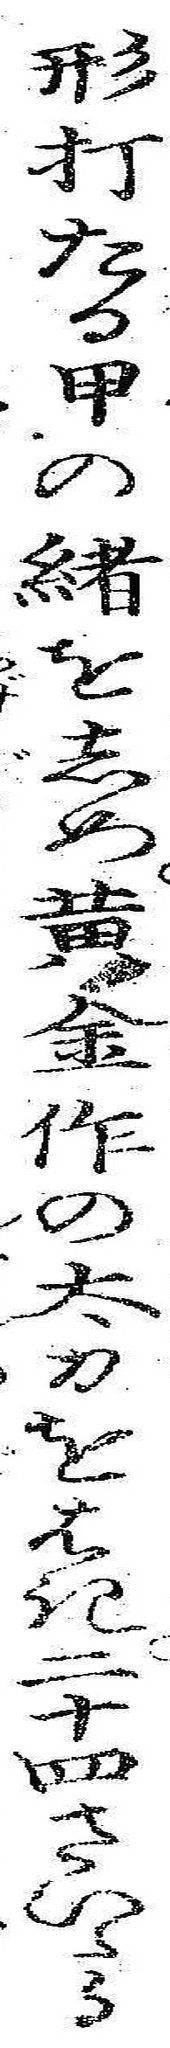形打たる甲の緒をしめ。黄金作の太力をはき。二十四さいたる
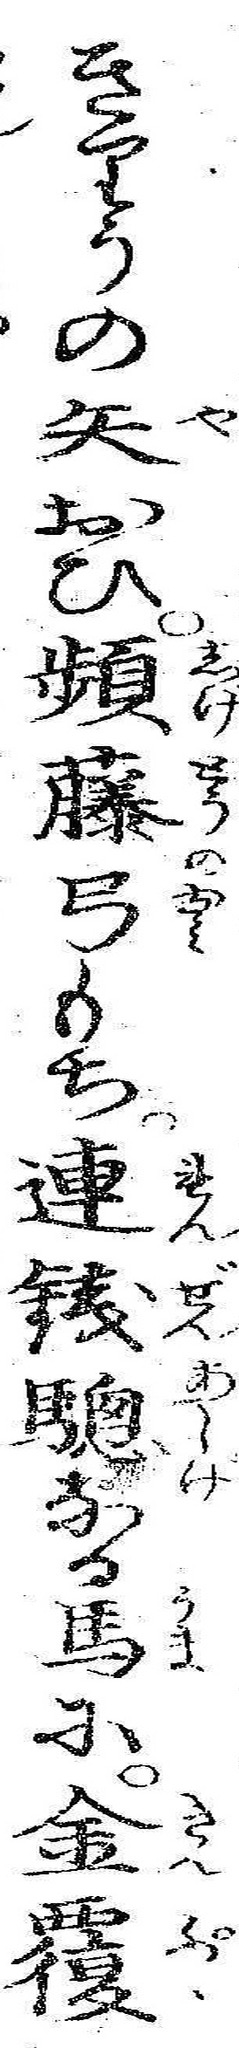きりうの矢おひ。頻藤弓もち。連銭驄なる馬に。金覆
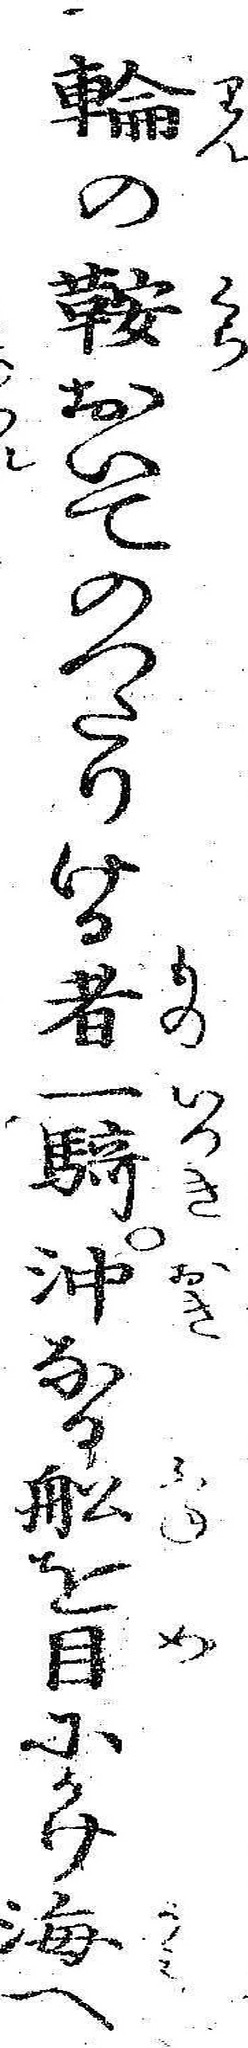輪の鞍おいてのつたりける者一騎。沖なる船を目にかけ海へ
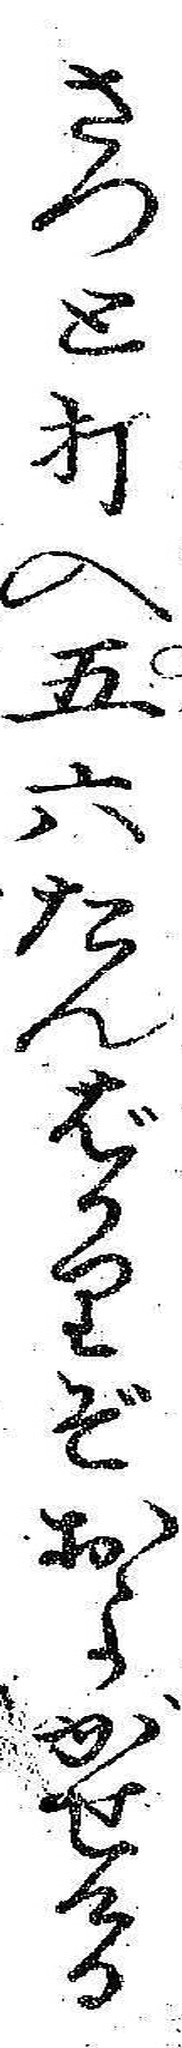さつと打入。五六たんばかりぞおよがせける
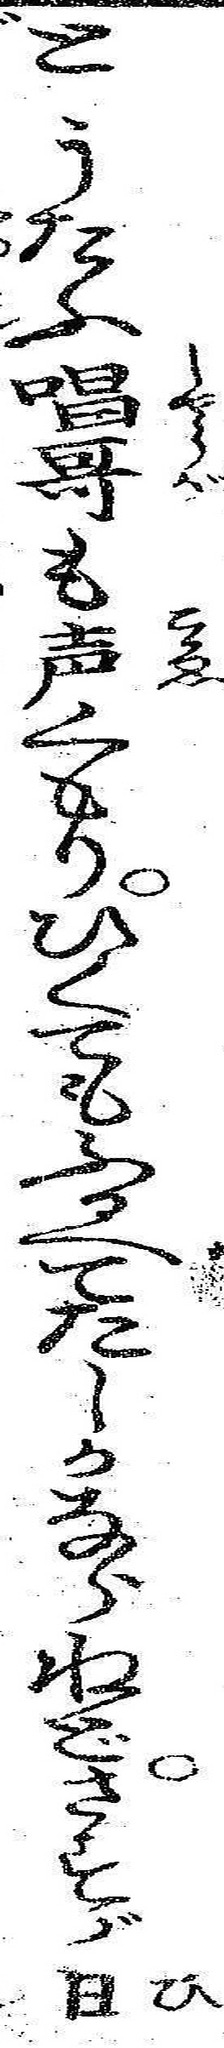とうたふ唱歌も声くもり。ひくてもふるへてたしかならねど。さすが日
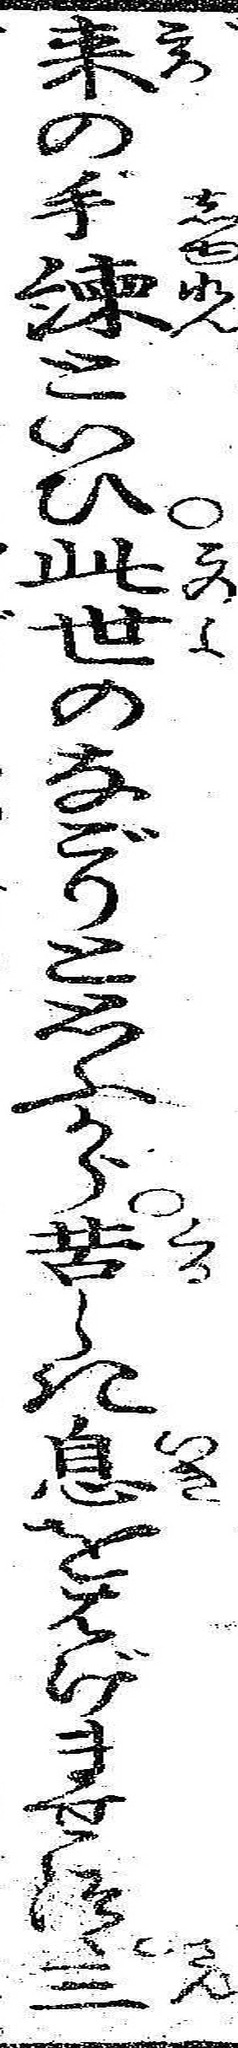来の手練といひ。此世のなごりと思ふから。苦しき息をはげませつゝ。三
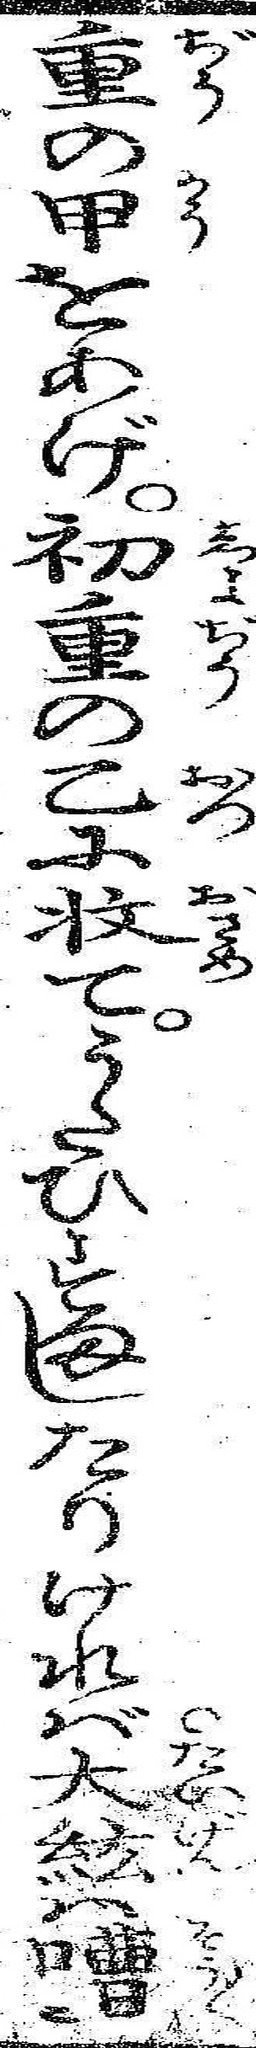重の甲をあげ。初重の乙に収て。うたひすしまたりければ。大絃は嘈
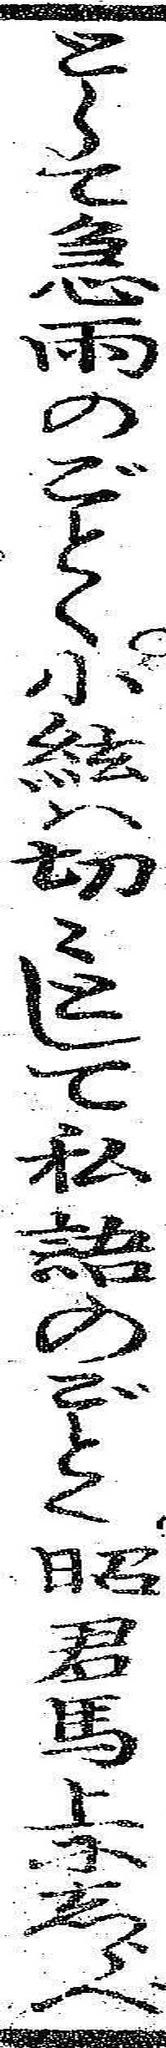として急雨のごとく。小絃は切々として私語のごとく。昭君馬上にしらべ。

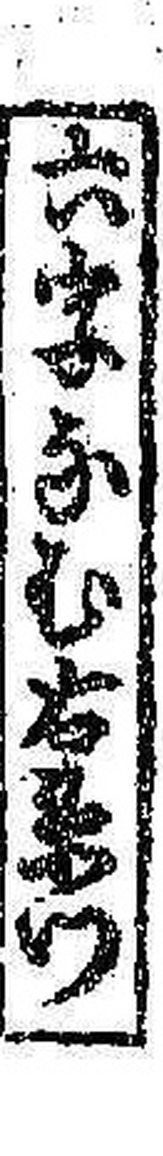六字なむ右衛門
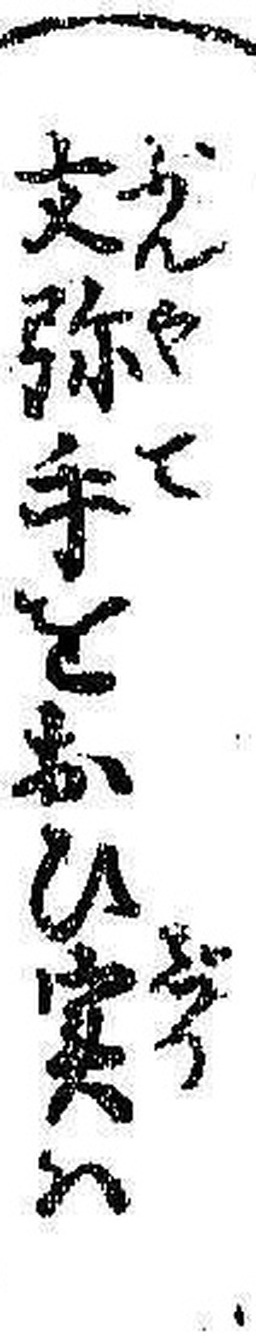文弥手をおひ実は
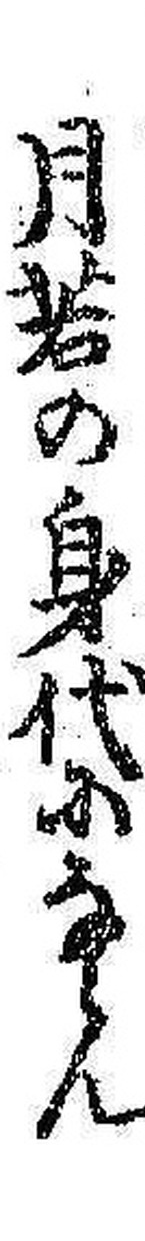月若の身代にならん
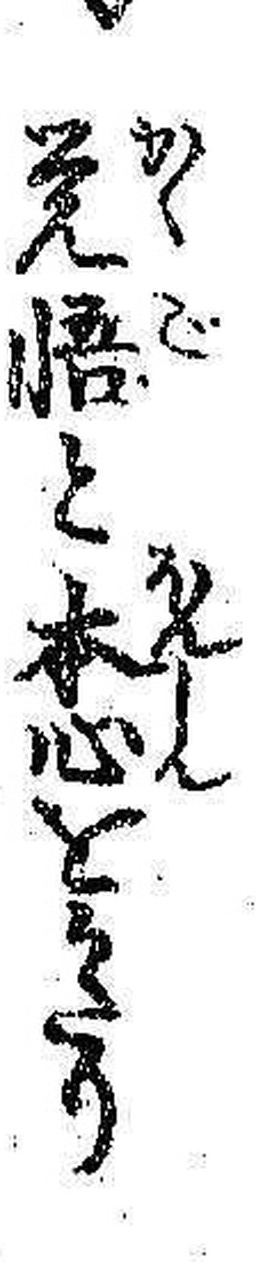覚悟と本心をかたり
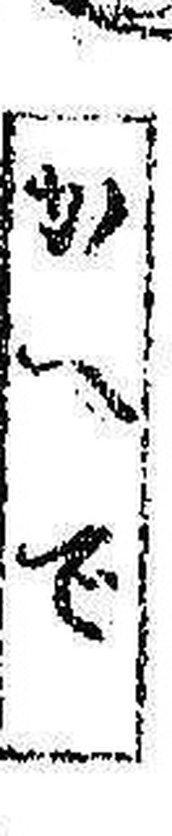かへで
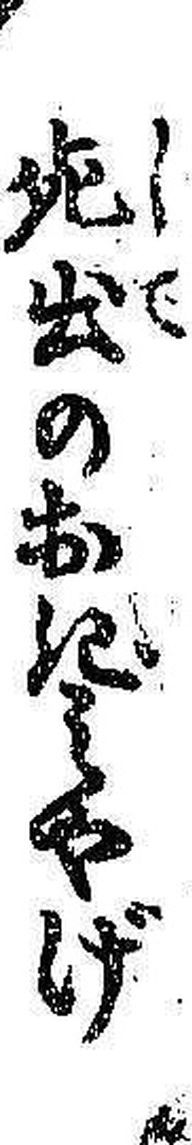死出のおきみやげ
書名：昔話稲妻表紙
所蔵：国文学研究資料館
